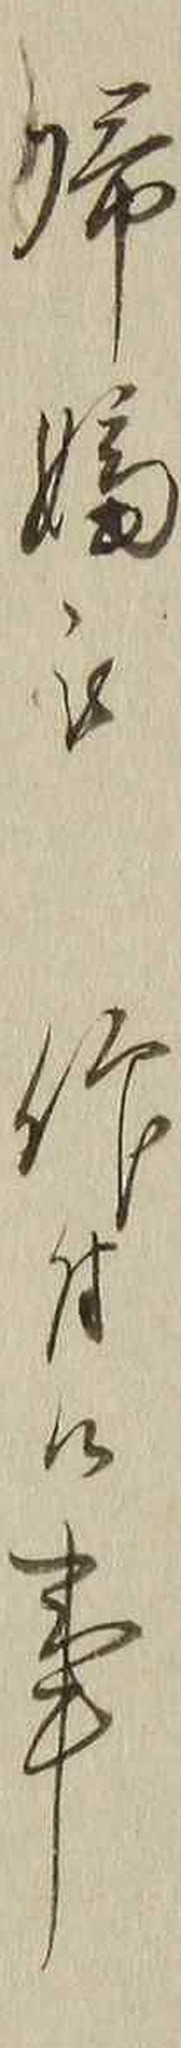帰嫡被仰付候事
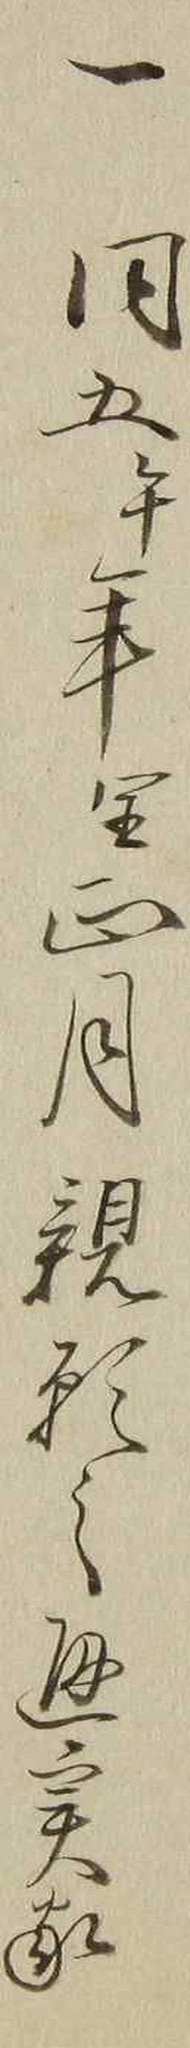一同五午年閏正月親願之通実家
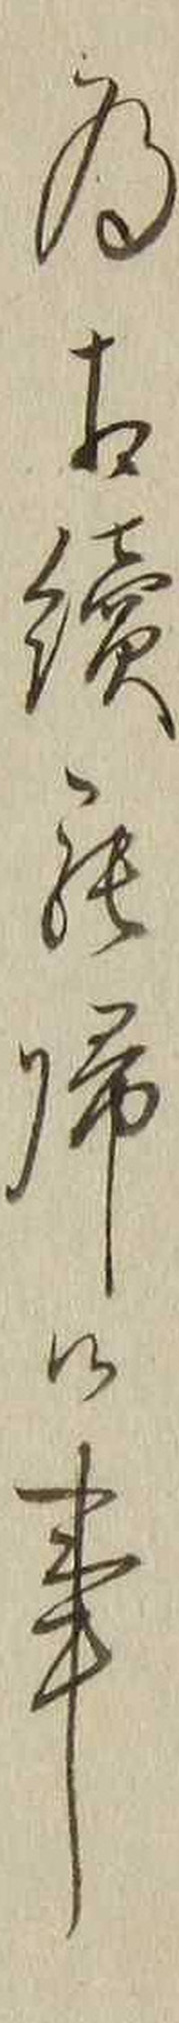為相続罷帰候事
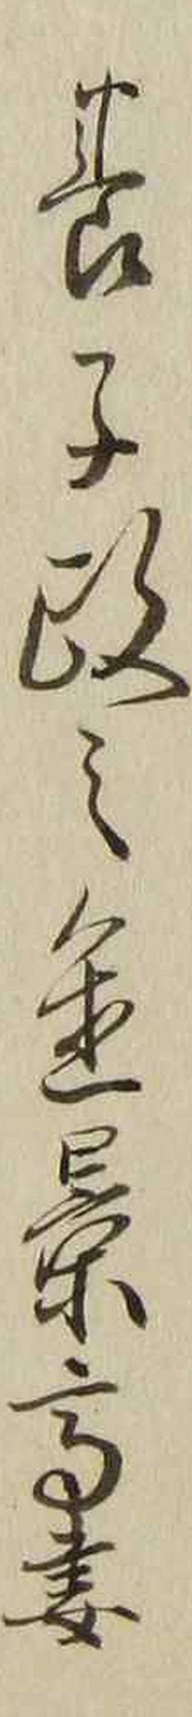養子政之進景高妻
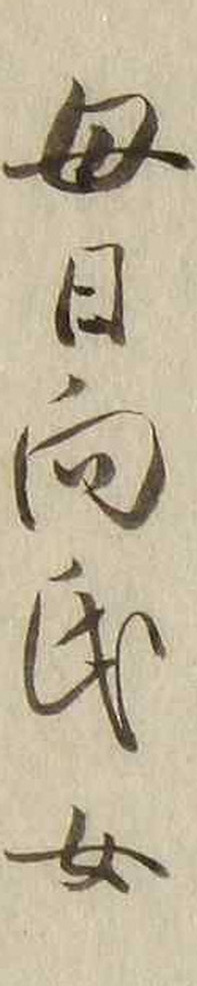母日向氏女

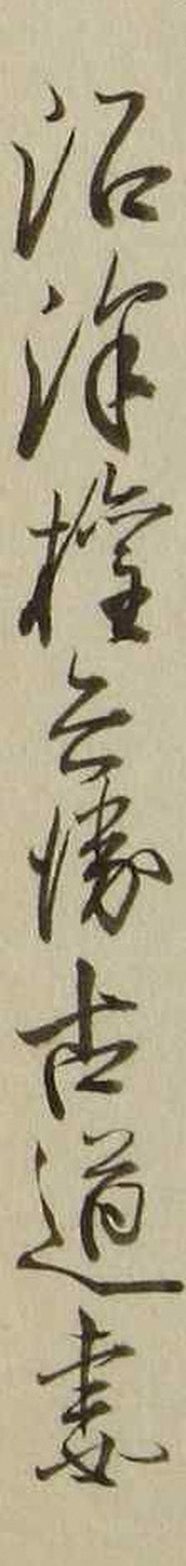沼澤権兵衛古道妻
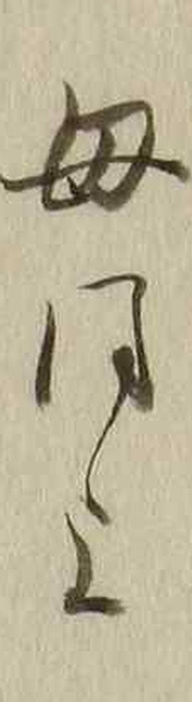母同上
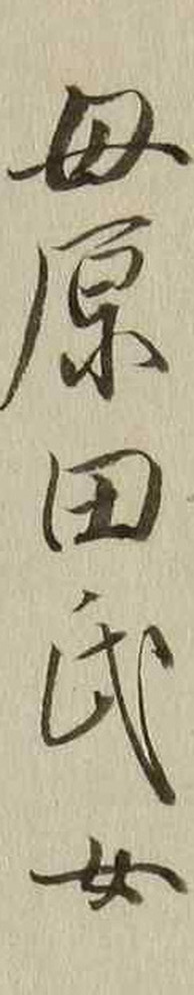母原田氏女
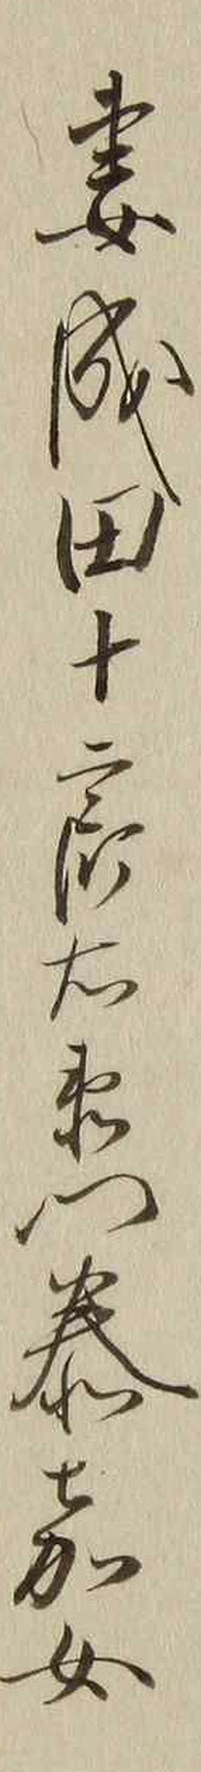妻成田十郎右衛門泰嘉女
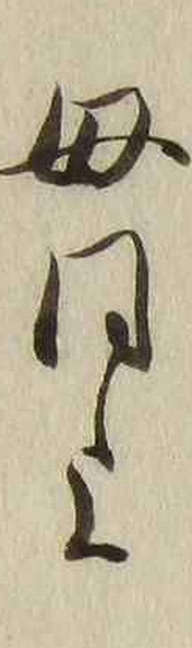母同上

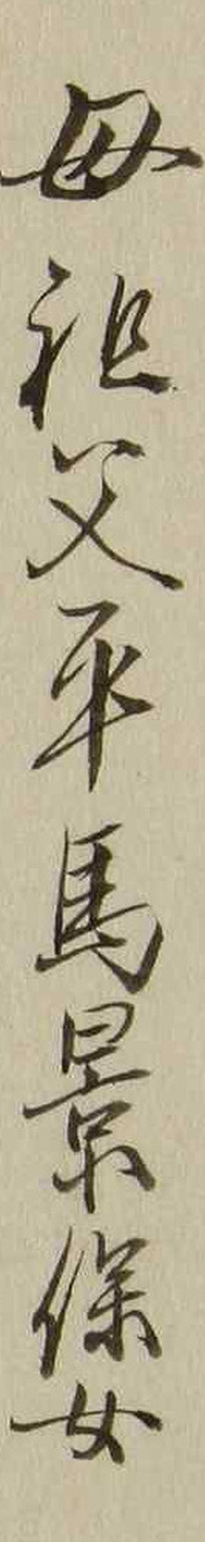母祖父平馬景保女
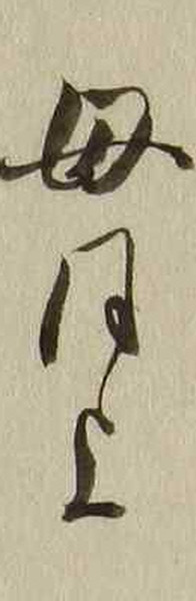母同上
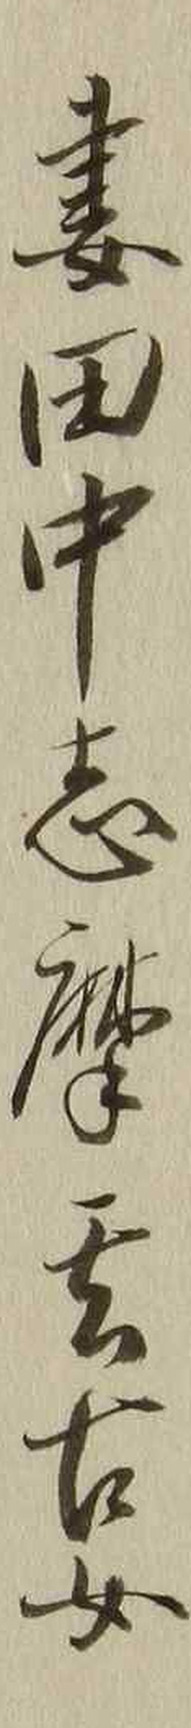妻田中志摩玄古女
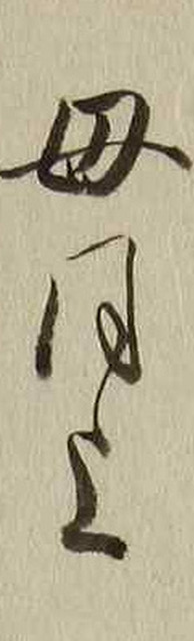母同上
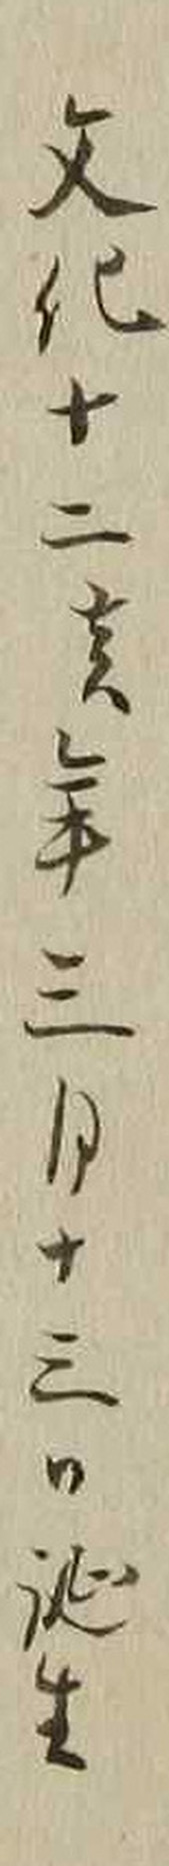女栄文化十二亥年三月十三日誕生
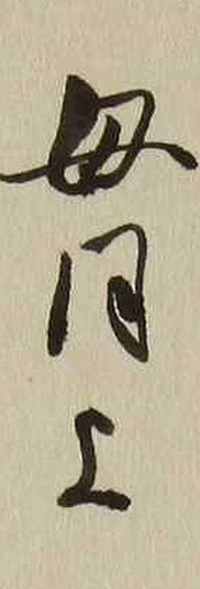母同上
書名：諸士系譜　巻之103　か之部11
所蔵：会津若松市立会津図書館
